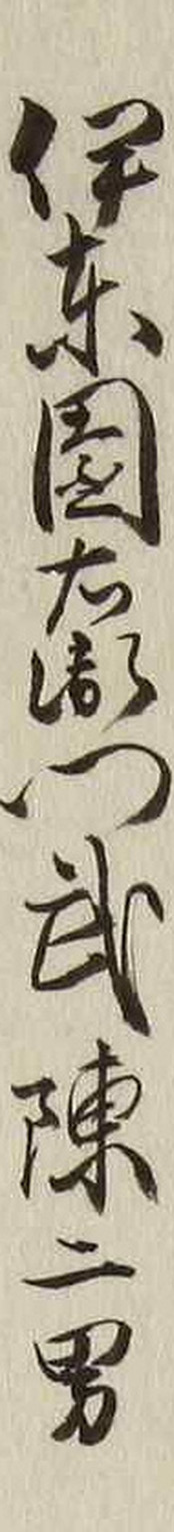伊東園右衛門武陳二男
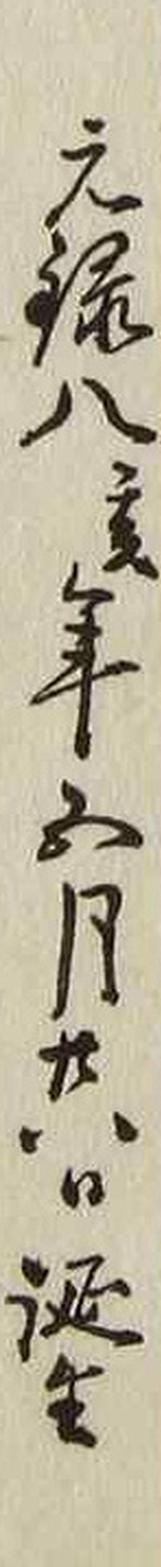元録八亥年五月廿八日誕生
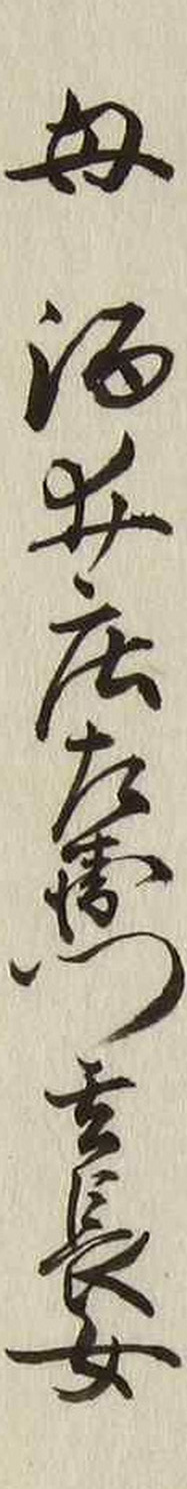母酒井庄左衛門玄長女
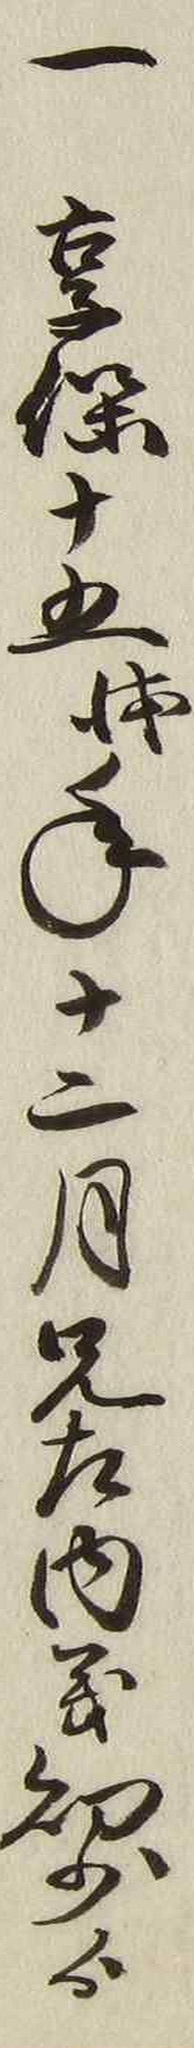一享保十五戌年十二月兄左内義幼少ゟ
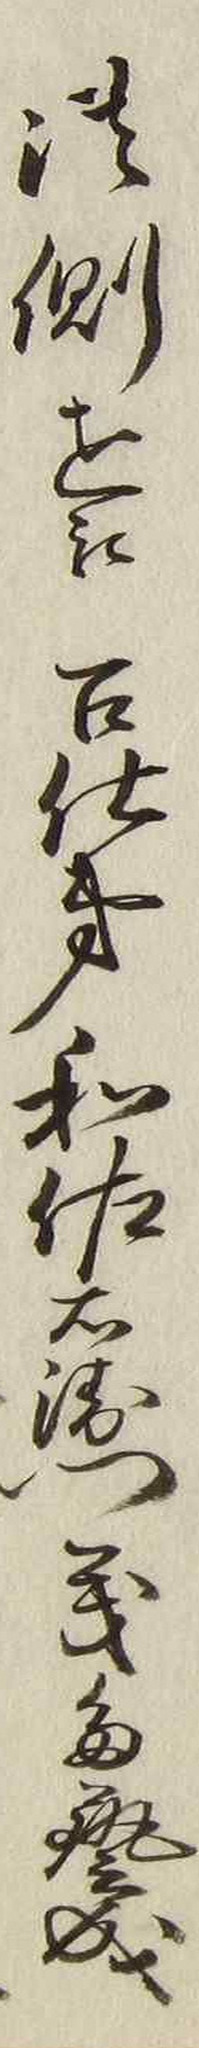御側を被召仕弟和佐右衛門義多芸成
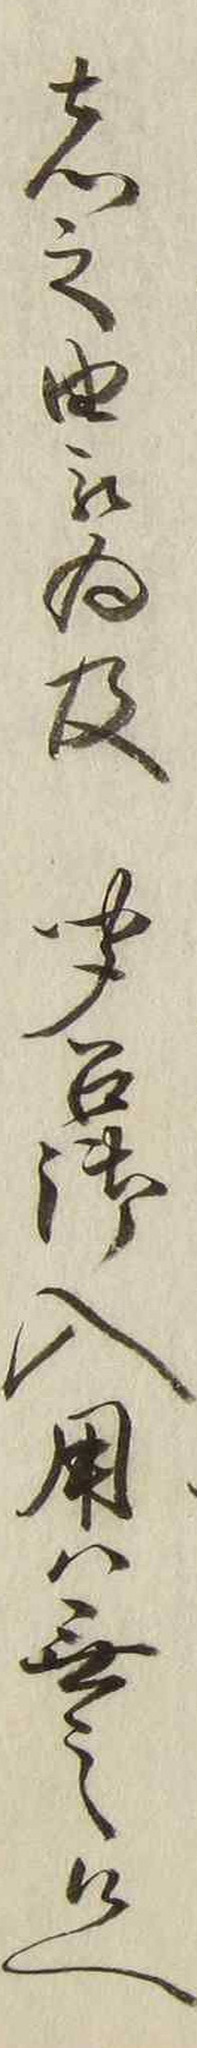者之由被為及聞召御入用ハ無之候へ

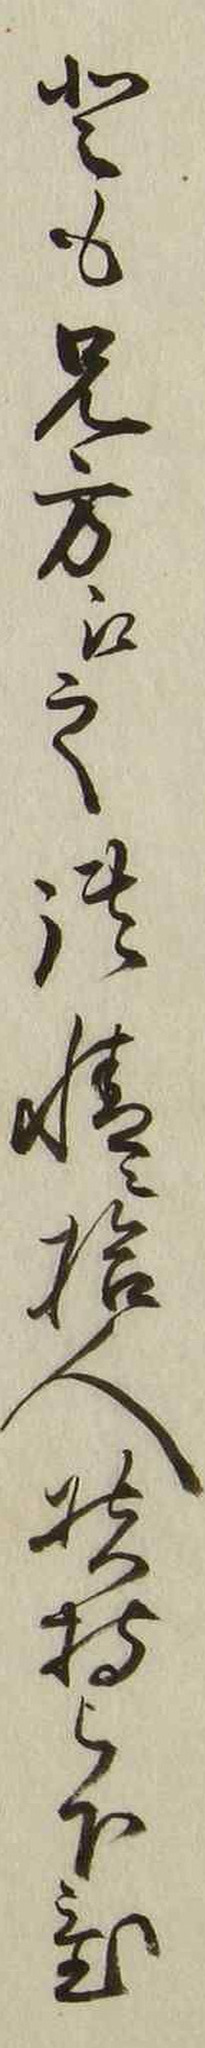とも兄方江之御情ニ拾人扶持被下置
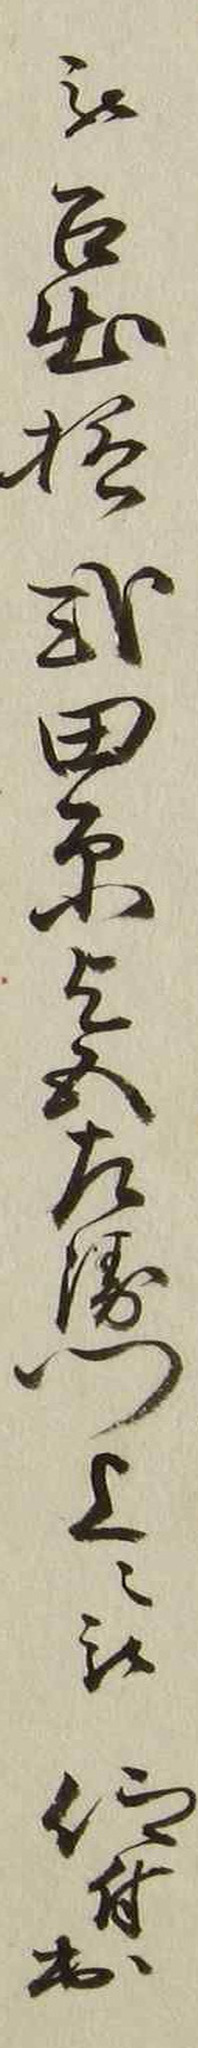被召出格式田原与五左衛門上ニ被仰付於
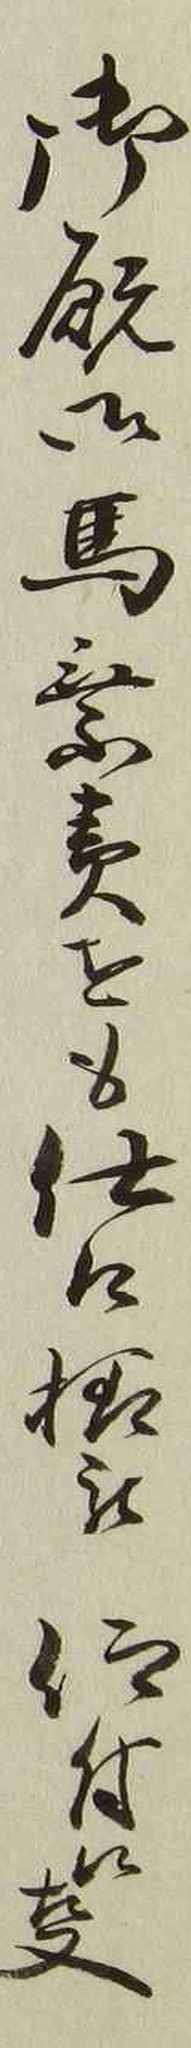御厩御馬乗責をも仕候様被仰付候事
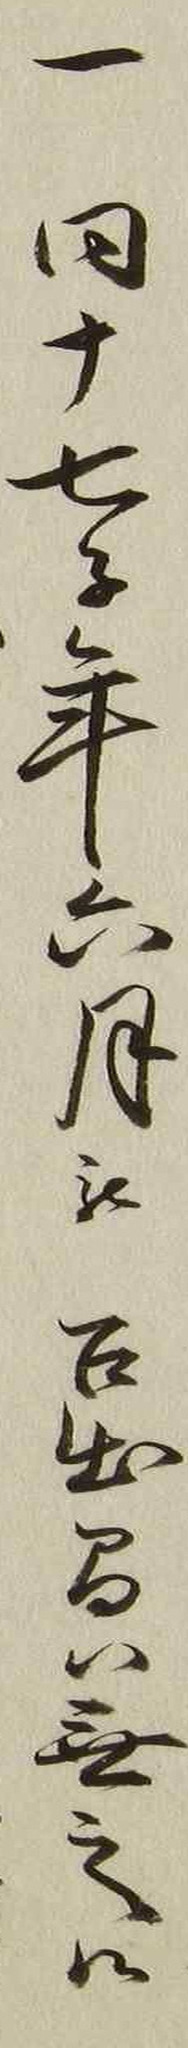一同十七子年六月被召出間ハ無之候
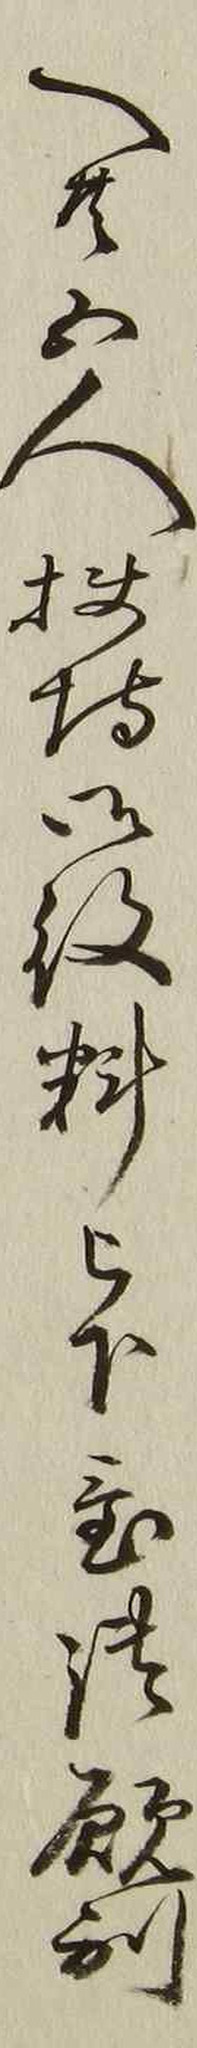へ共五人扶持御役料被下置御厩別
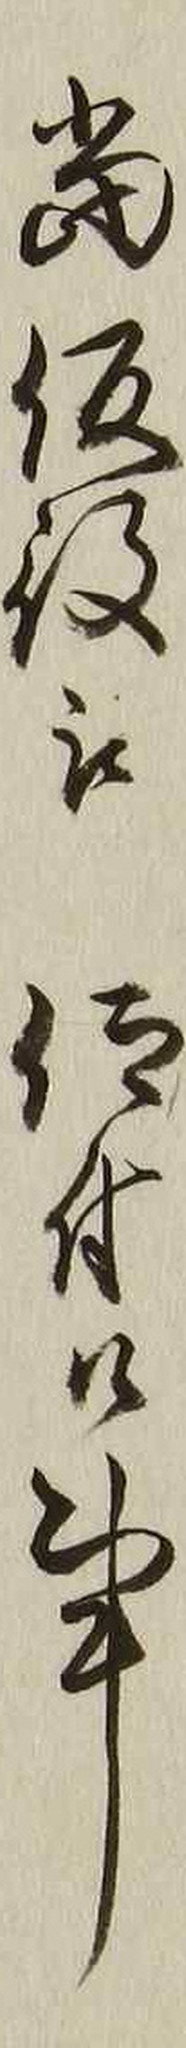当仮役被仰付候事
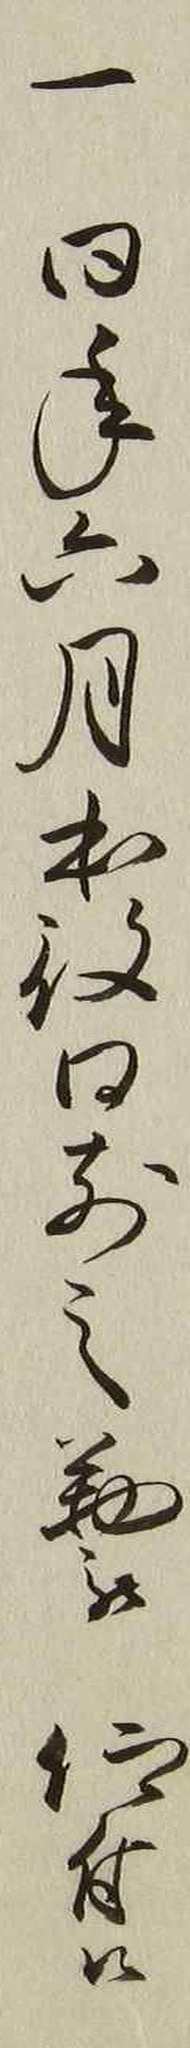一同年六月本役同前之勤被仰付候
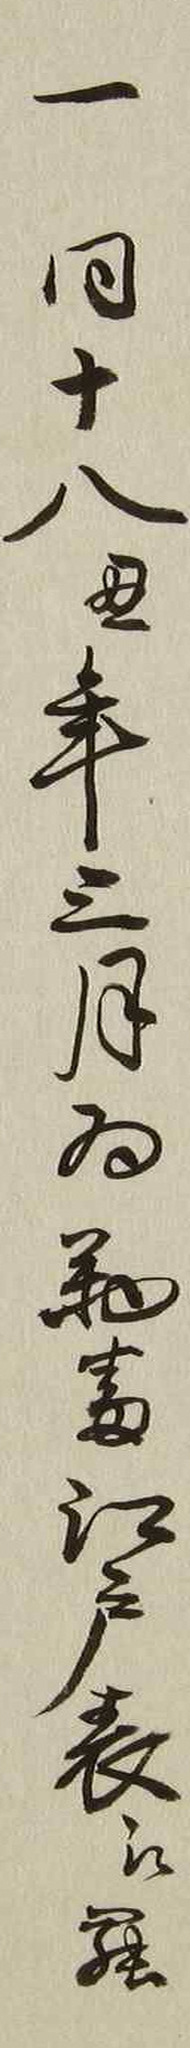一同十八丑年三月為勤番江戸表江罷
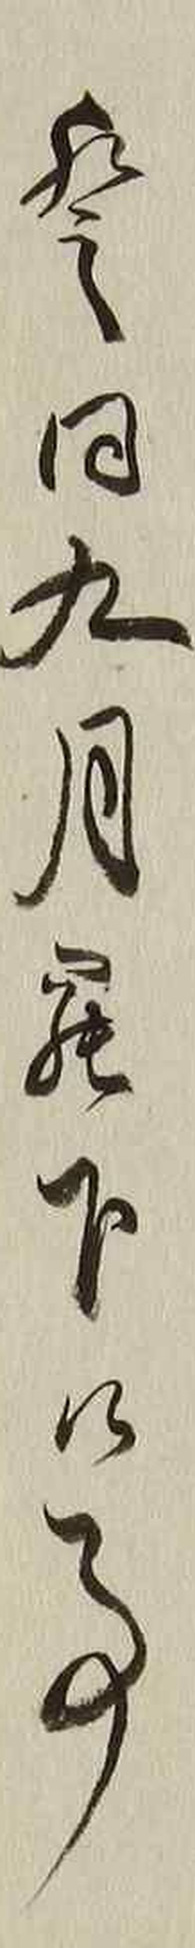登同九月罷下候事
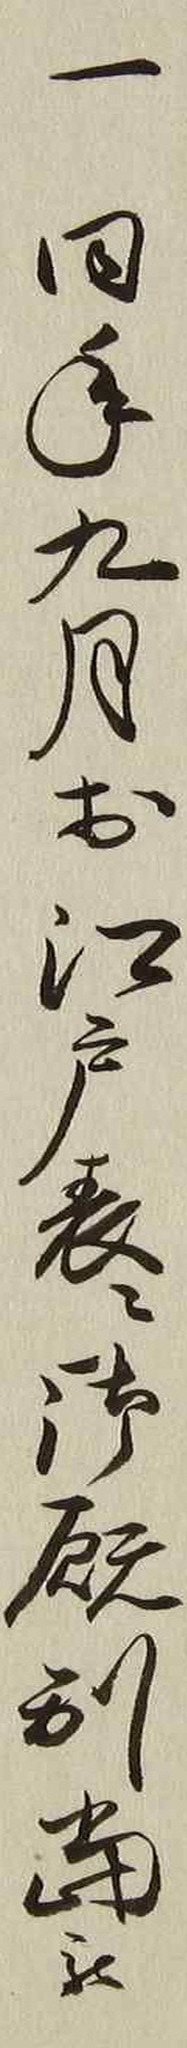一同年九月於江戸表ニ御厩別当被
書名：諸士系譜　巻之21　い之部21
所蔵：会津若松市立会津図書館
